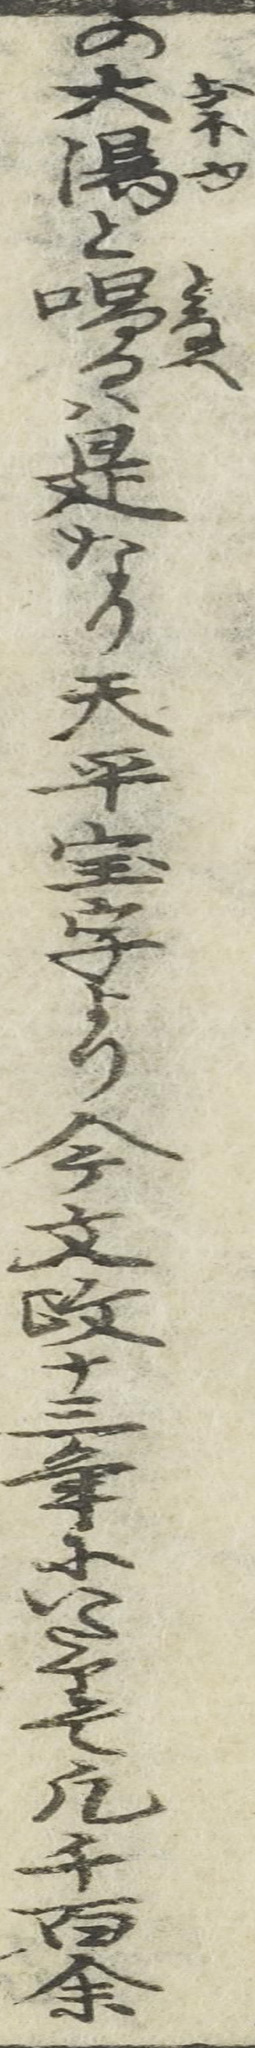の大湯と唱るは是なり天平宝字より今文政十三年にいたりて凡千百余
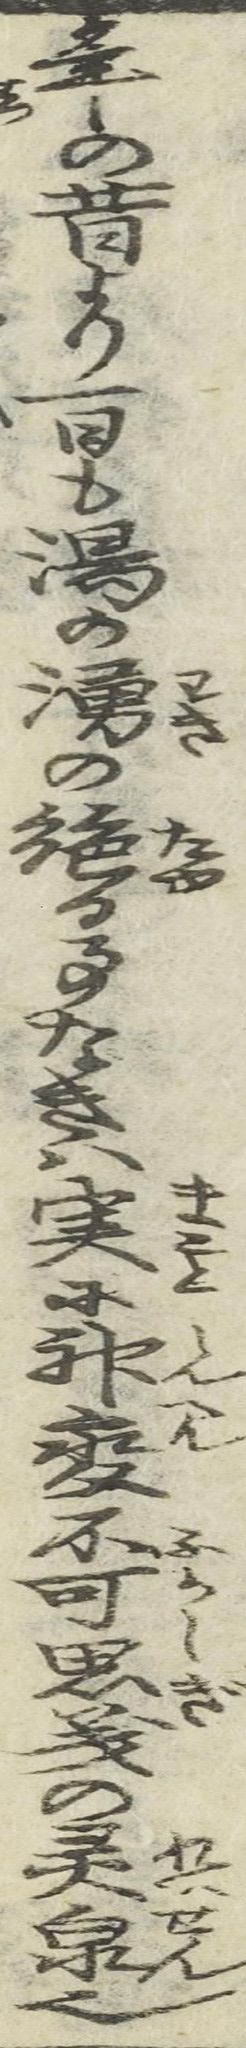年？の昔より一日も湯の湧の絶る事なきは実に神変不可思義の霊泉也
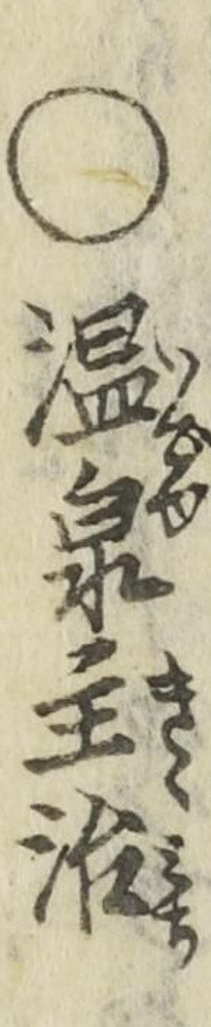○温泉主治
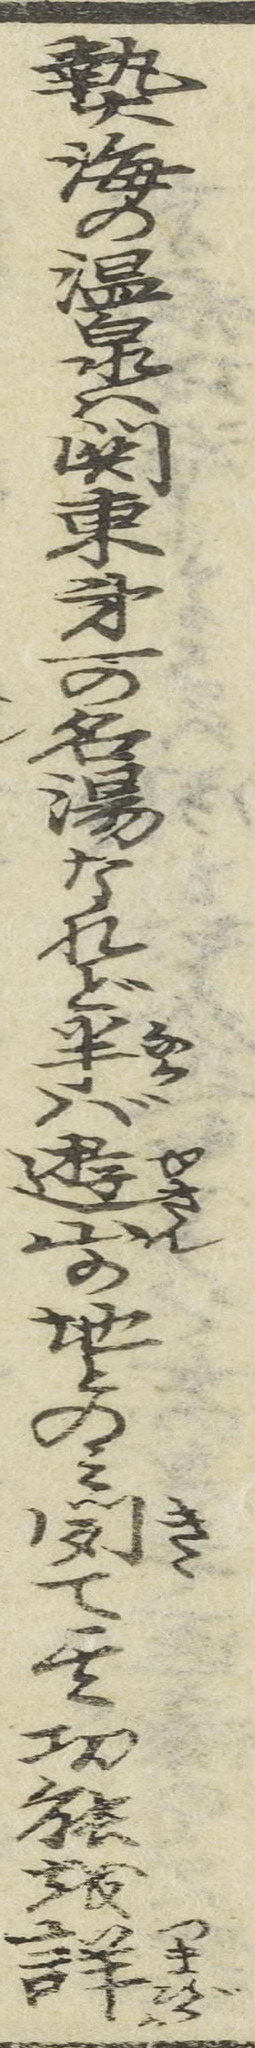熱海の温泉は関東第一の名湯なれど半ば遊山の地とのみ聞て其功能を詳
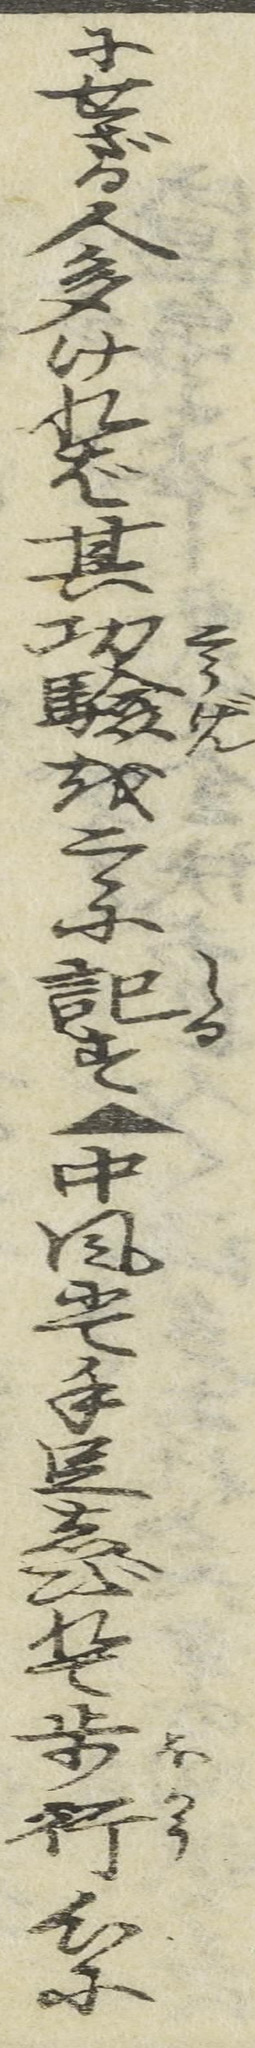にせざる人多ければ其功験をこゝに記す▲中風にて手足しびれて歩行心に
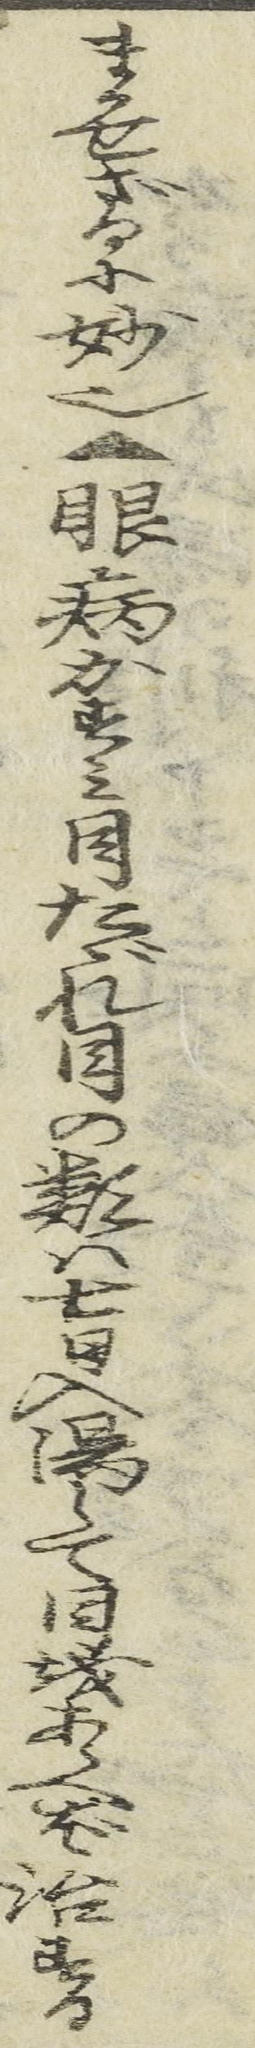まかせざるに妙也▲眼病かすみ目たゞれ目の類は七日入湯して目をあらへば治する
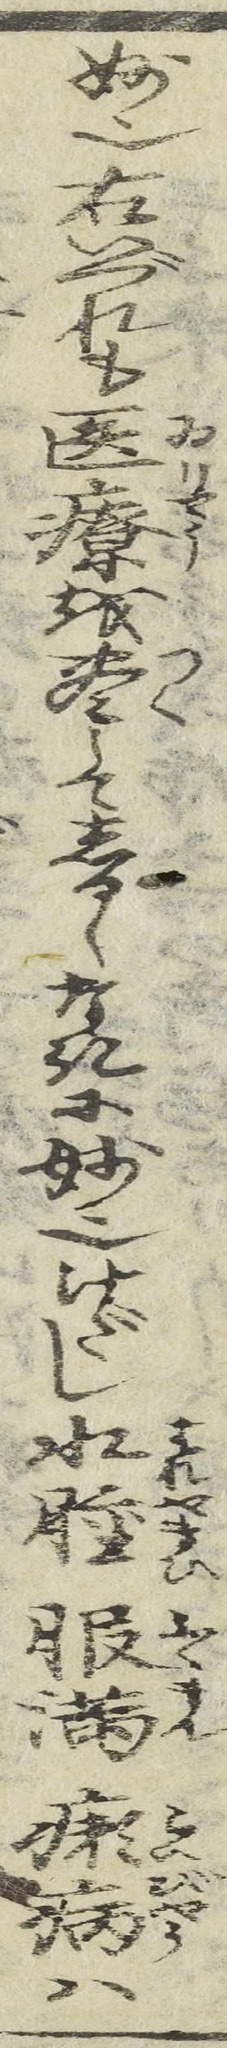妙也右いづれも医療を尽してしるしなきに妙也けだし水腫服満癩病は
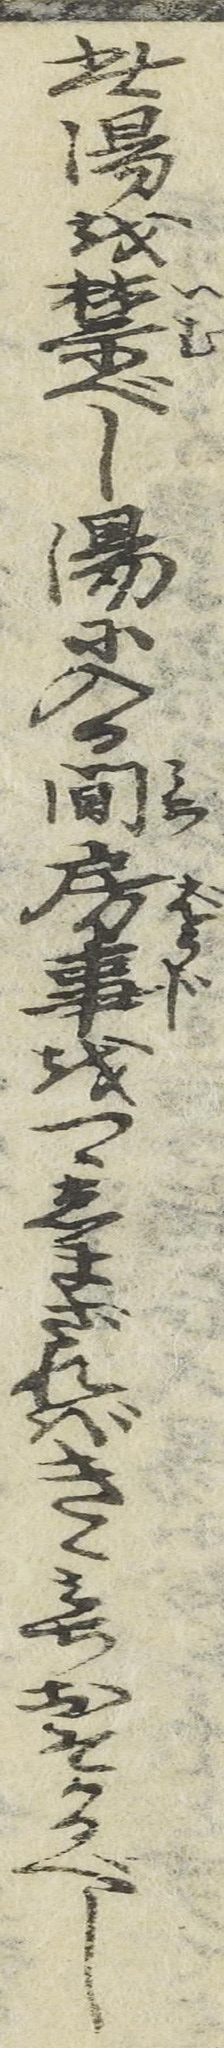此湯を禁べし湯に入る間房事をつゝしまざればきゝめおそかるべし
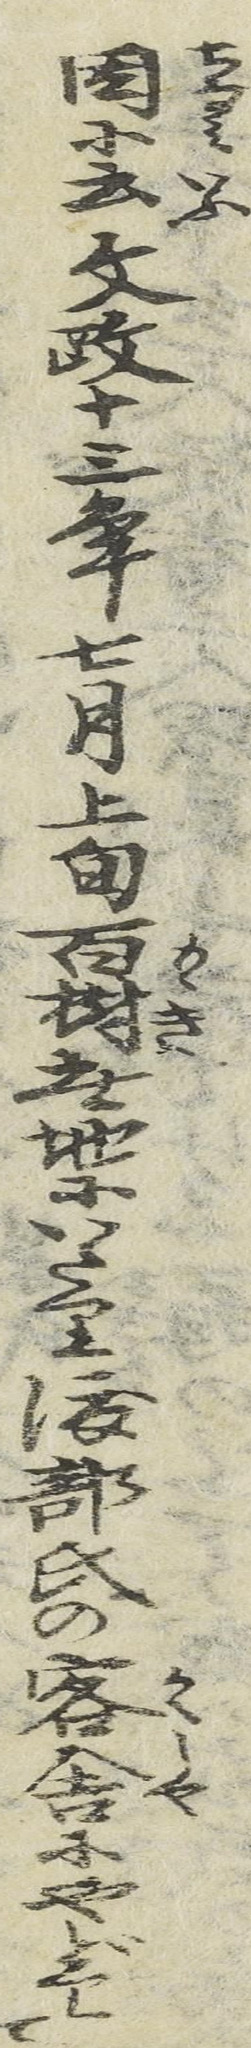因に云文政十三年七月上旬百樹此地にいたり渡部氏の客舎にやどりて
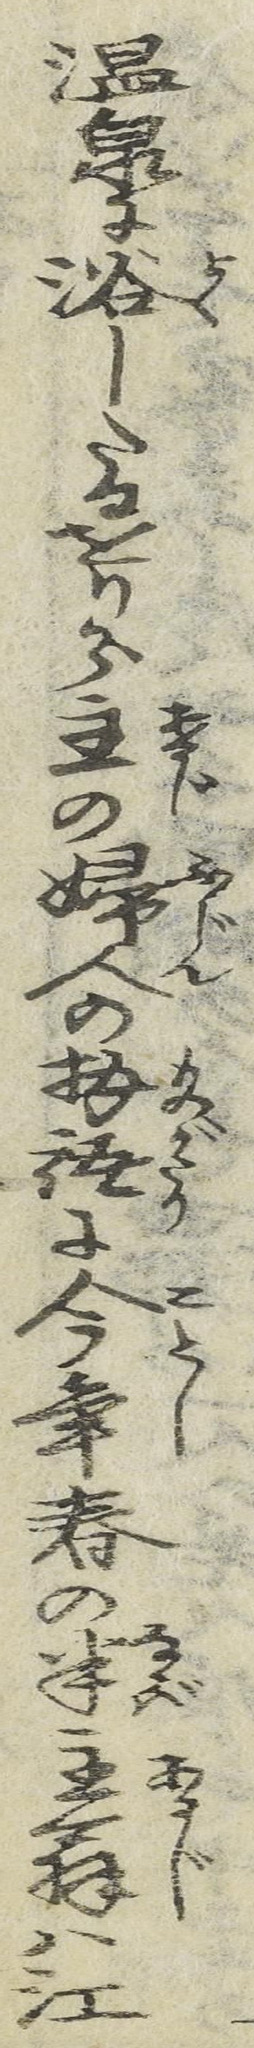温泉に浴したるをりから主の婦人の物語に今年春の半主翁は江

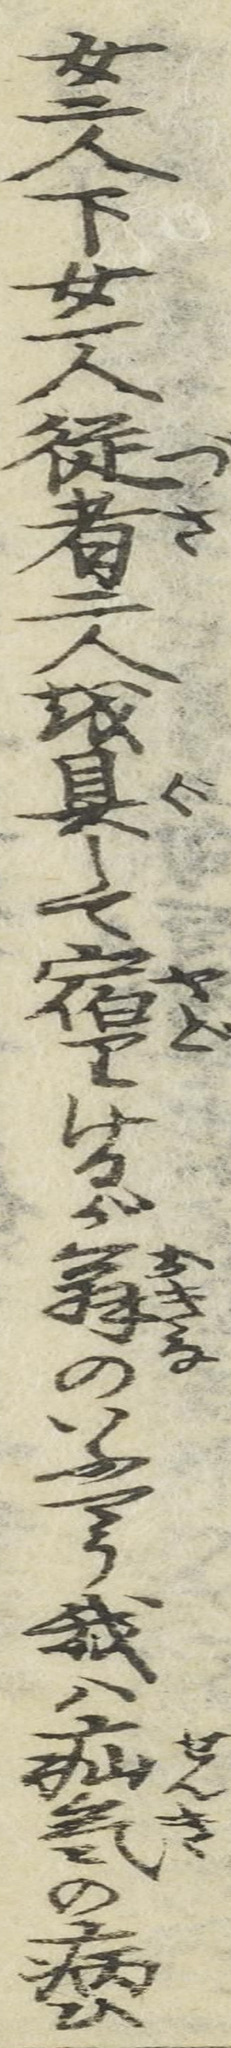女二人下女一人従者二人を具して宿りけるが翁のいふやう我は疝記の病ひ
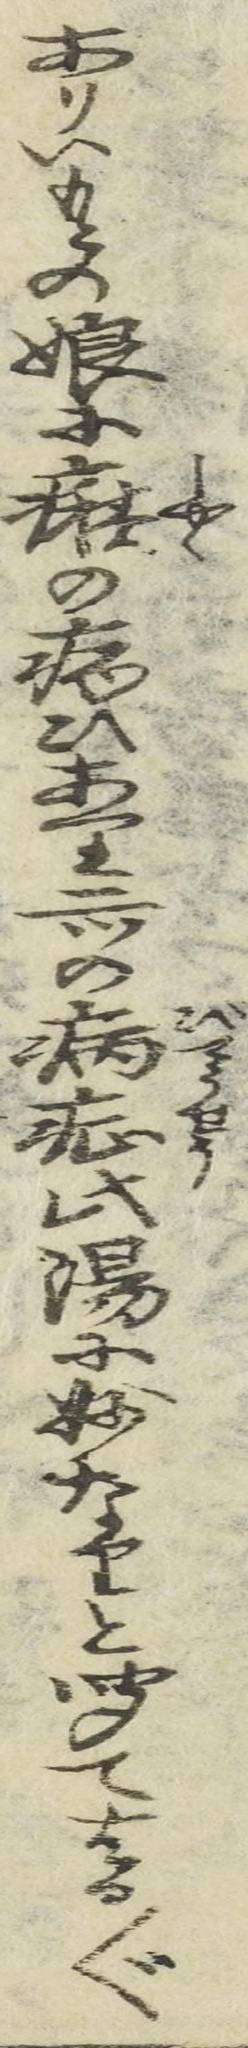ありいもとの娘に癪の病ひあり二つの病症此湯に妙なりと聞きてはる〴〵
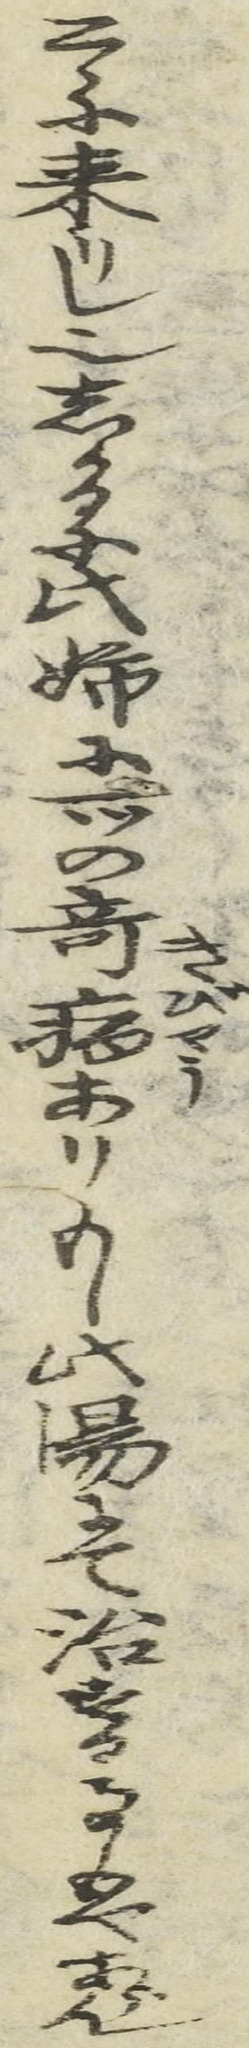こゝに来りし也しかるに此姉に一つの奇病ありもし此湯にて治する事もやあらん
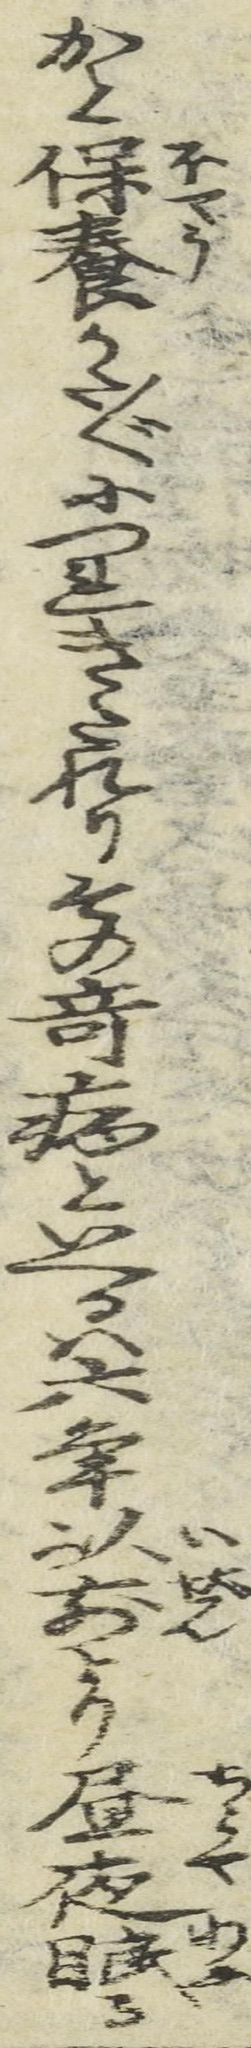かと保養かた〴〵につれきたれりその奇病といへるは六年以前より昼夜眠る
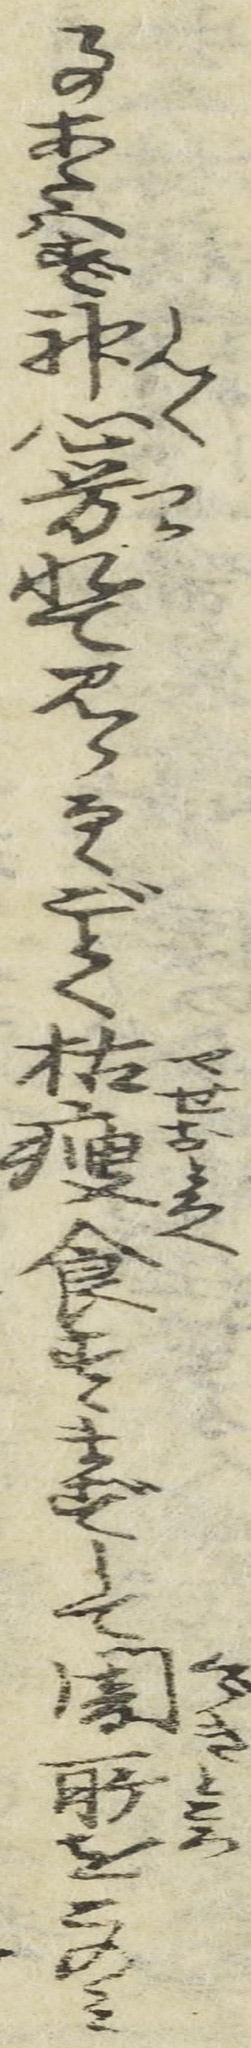事あたはず神心労れて見らるゝごとく枯痩食すゝまずして闇所をこのみ
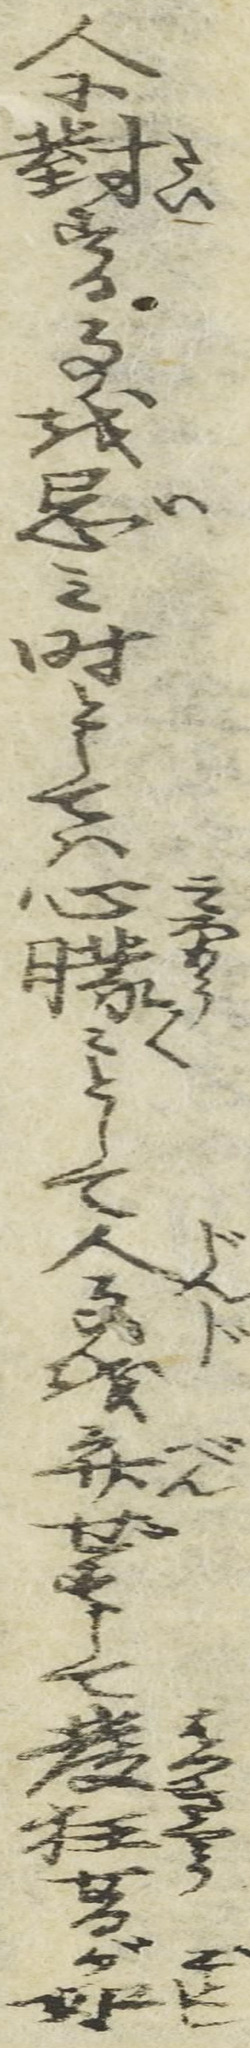人に對する事を忌み時としては心朦々として人事を弁ぜずして発狂せるが如
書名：熱海温泉圖彙
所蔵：東京大学地震研究所図書室 Earthquake Research Institute Library, The University of Tokyo, JAPAN
